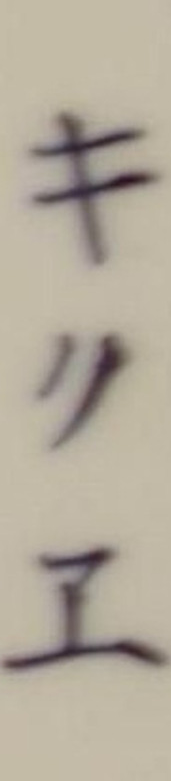キクエ
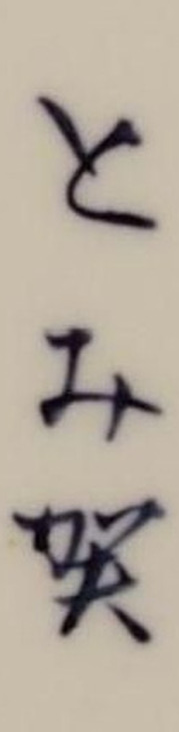とみか
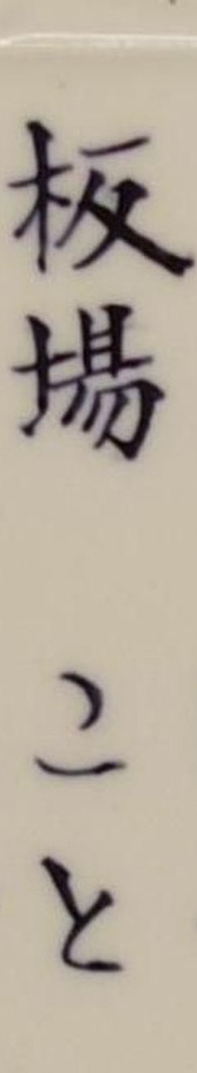板場こと
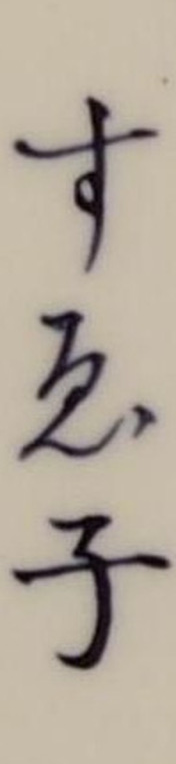すえ子
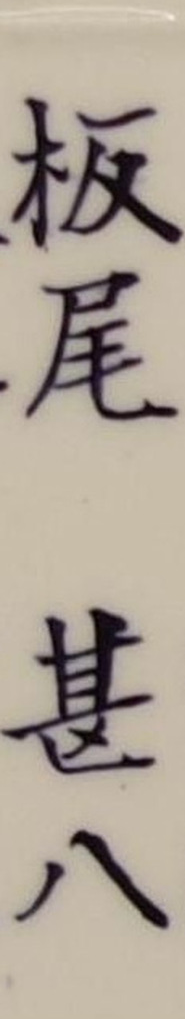板尾甚八
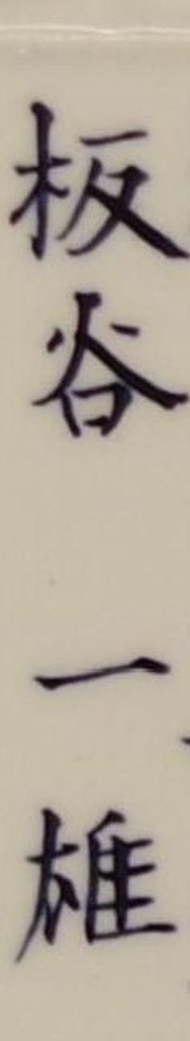板谷一雄
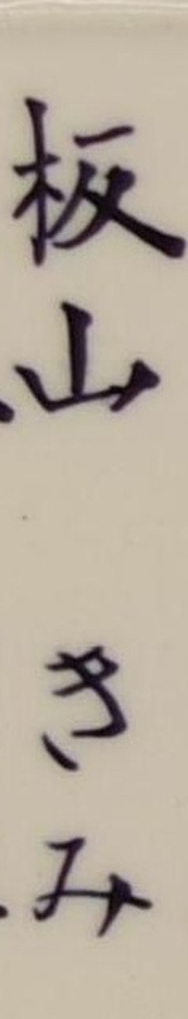板山きみ
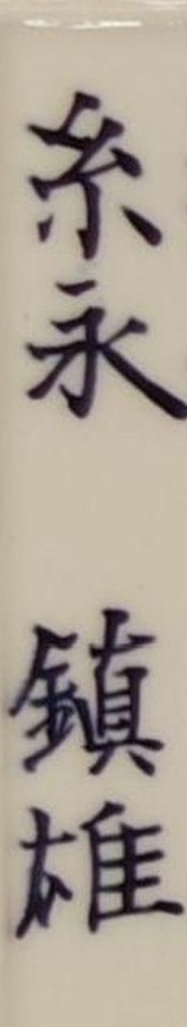糸永鎮雄

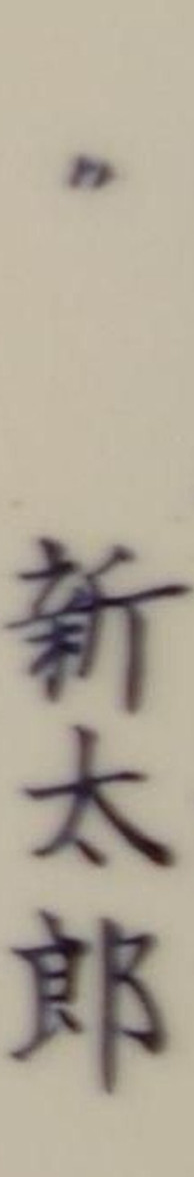新太郎
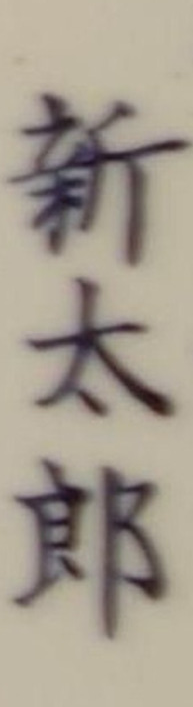新太郎
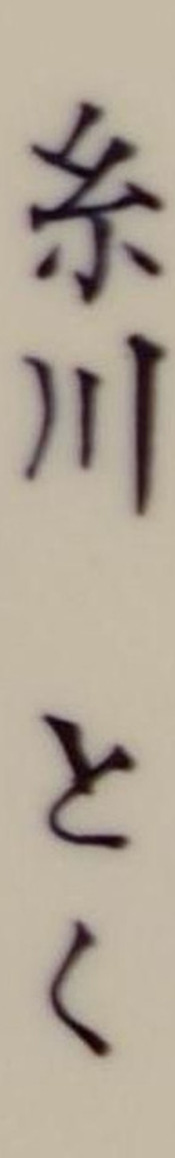糸川とく
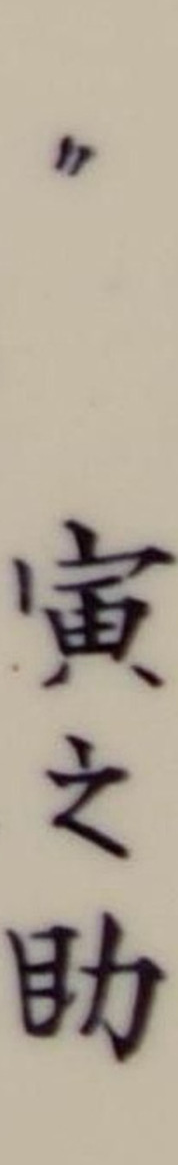寅之助
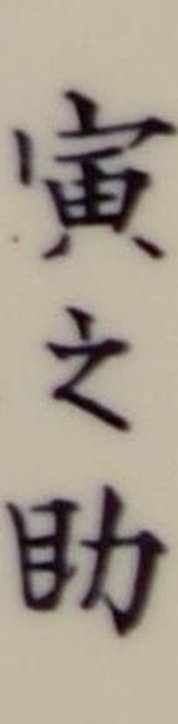寅之助
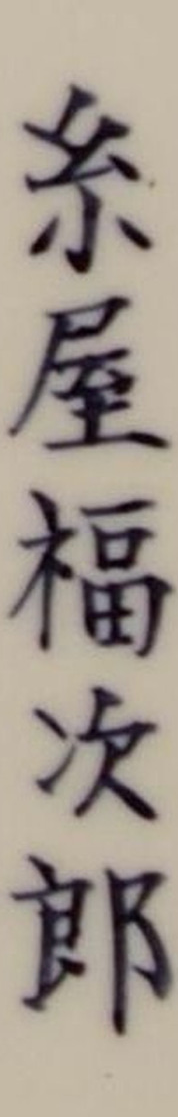糸屋福次郎
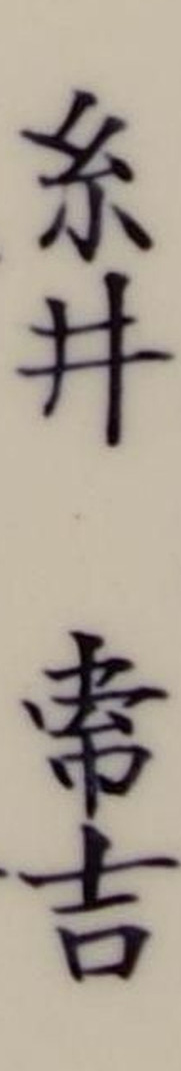糸井常吉
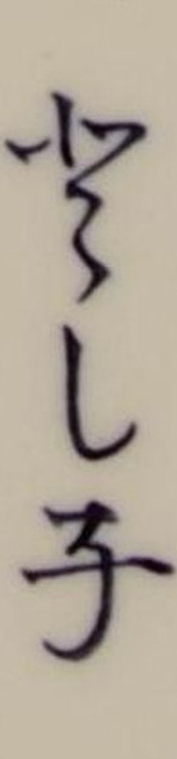とし子
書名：M~S
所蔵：高野山金剛峯寺
